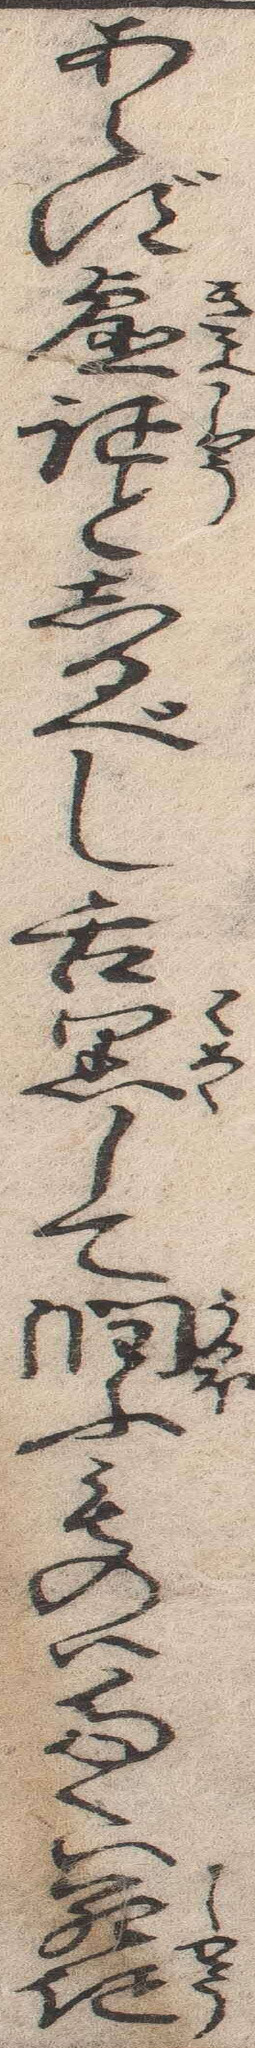あらず虚証としるべし舌黒して潤ふものは多くは死証

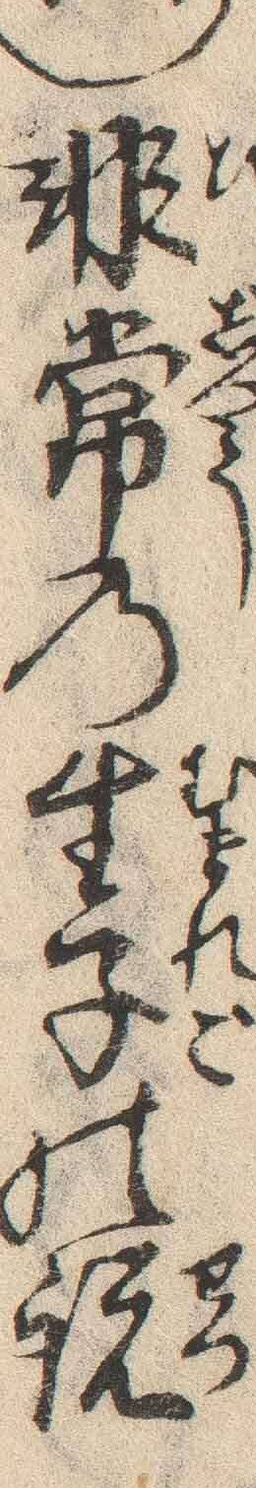㊅非常の生子の説
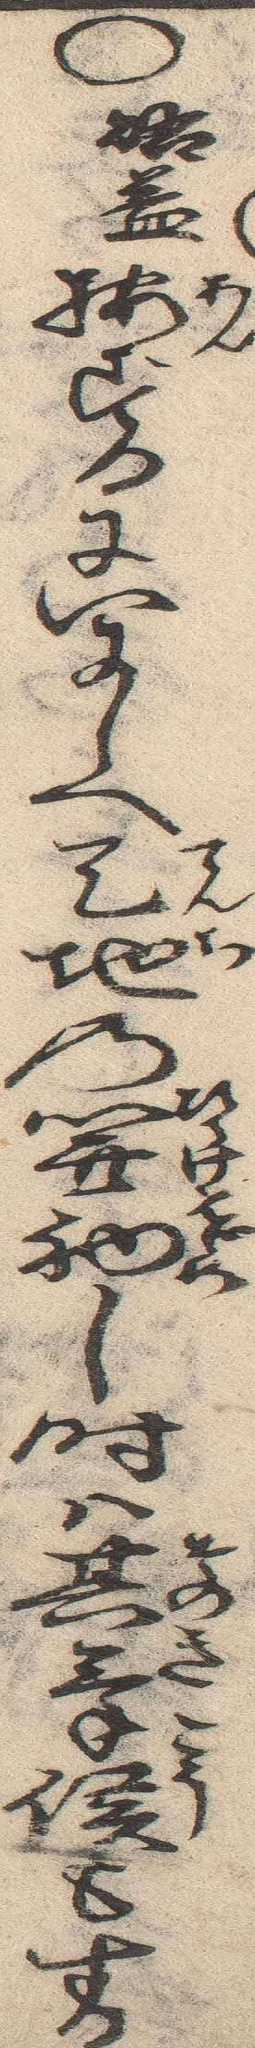◯啓益按ずるにいにしへ天地の開初し時は其氣候もする
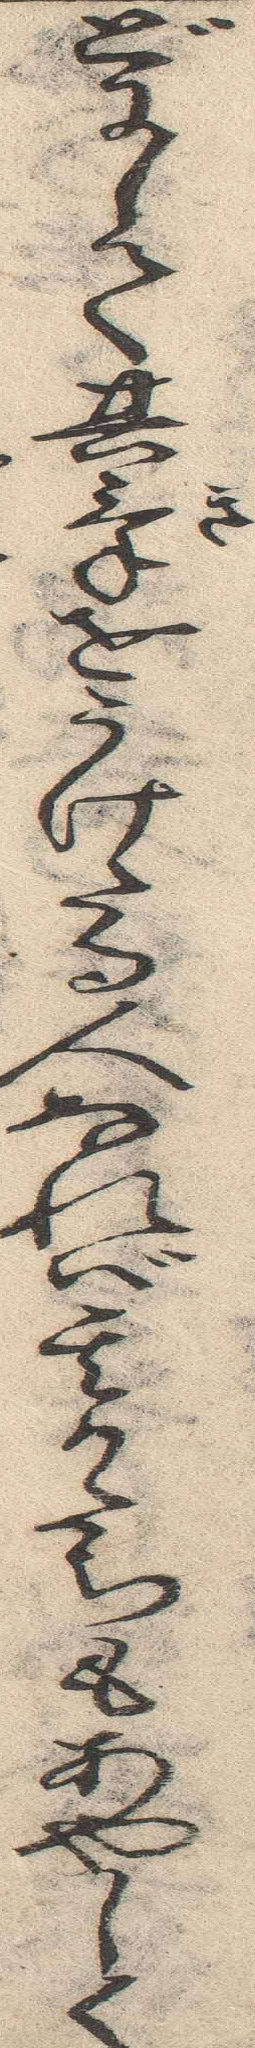どにして其氣をうけたる人なれば其かたちもあやしく
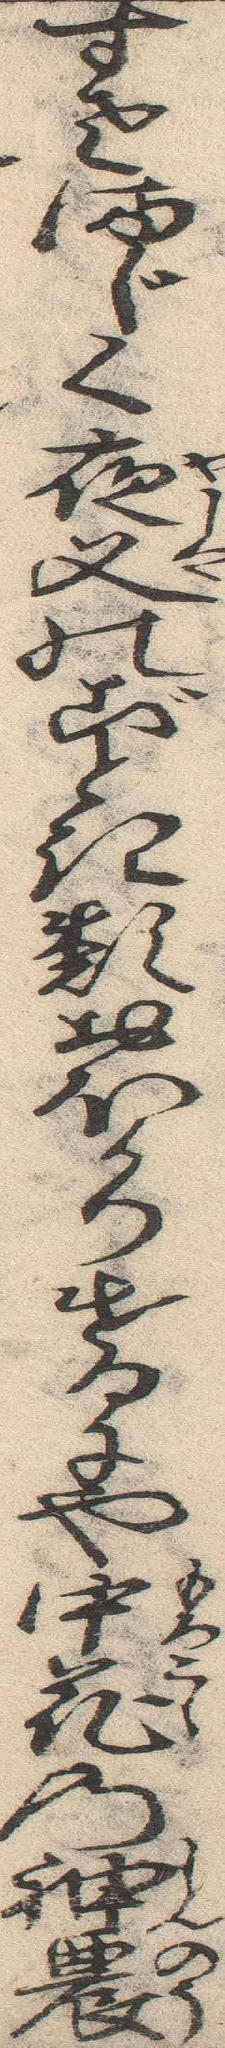すさまじく夜叉のごとき類おほかりけるにや中花の神農
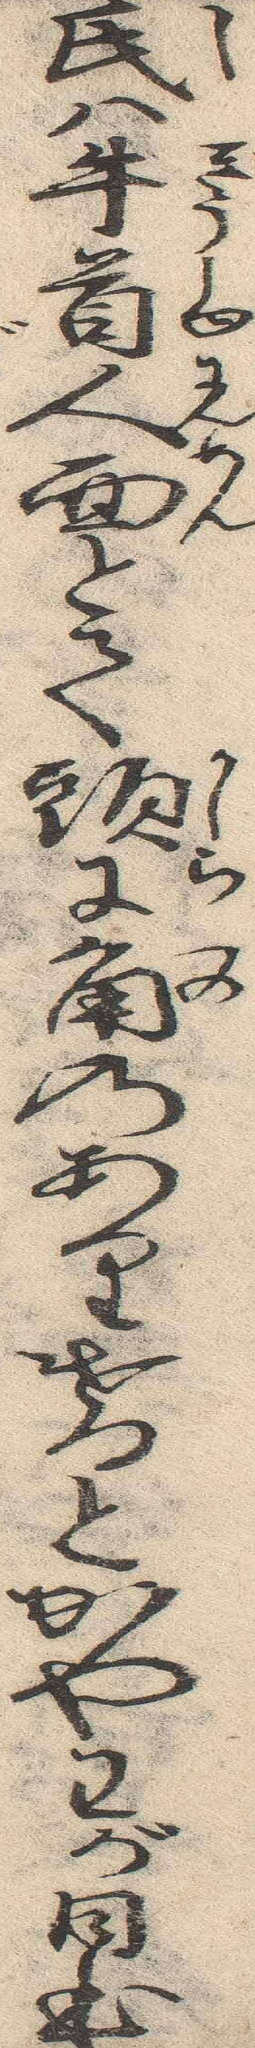氏は牛首人面とて頭に角のありけるとかやわが日本
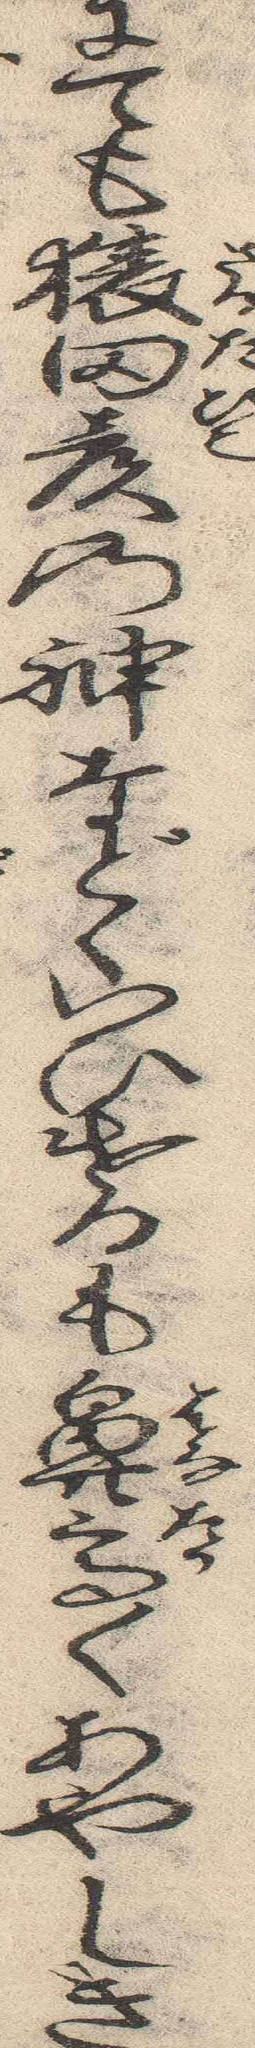にても猿田彦の神などゝいひけるも鼻高くあやしき
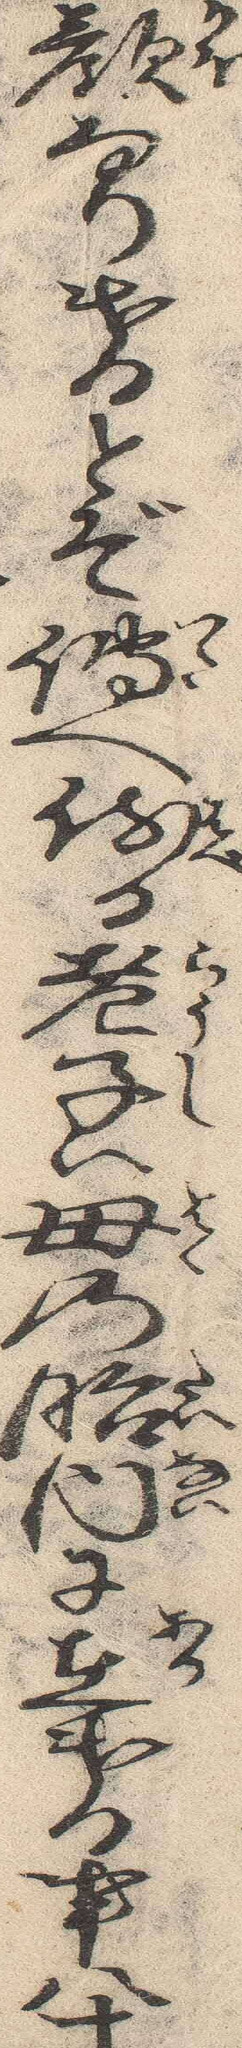顔なりけるとぞ傳へ侍る老子は母の胎内に在ける事八十
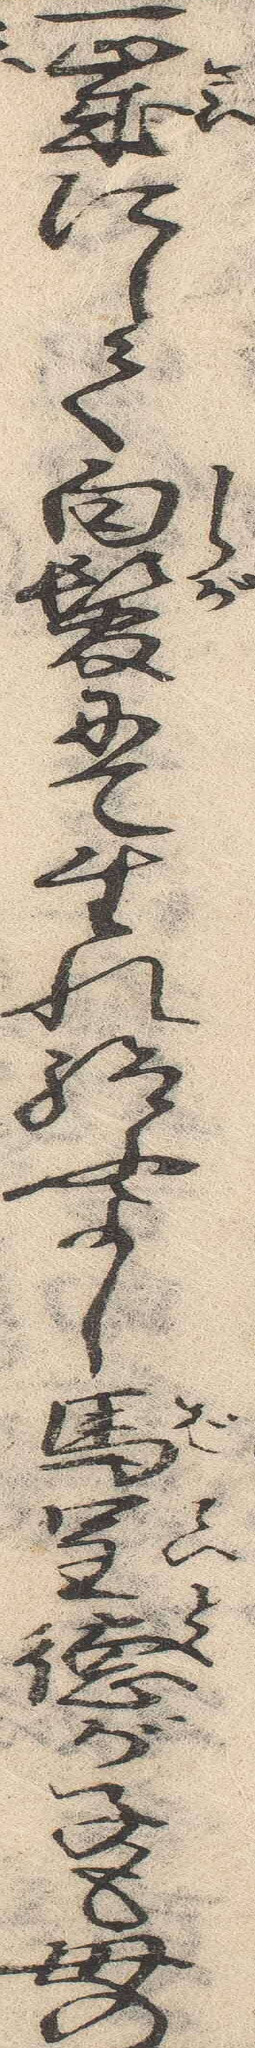一歳にして白髪にて生れ給ふよし馬呈徳が子も母の
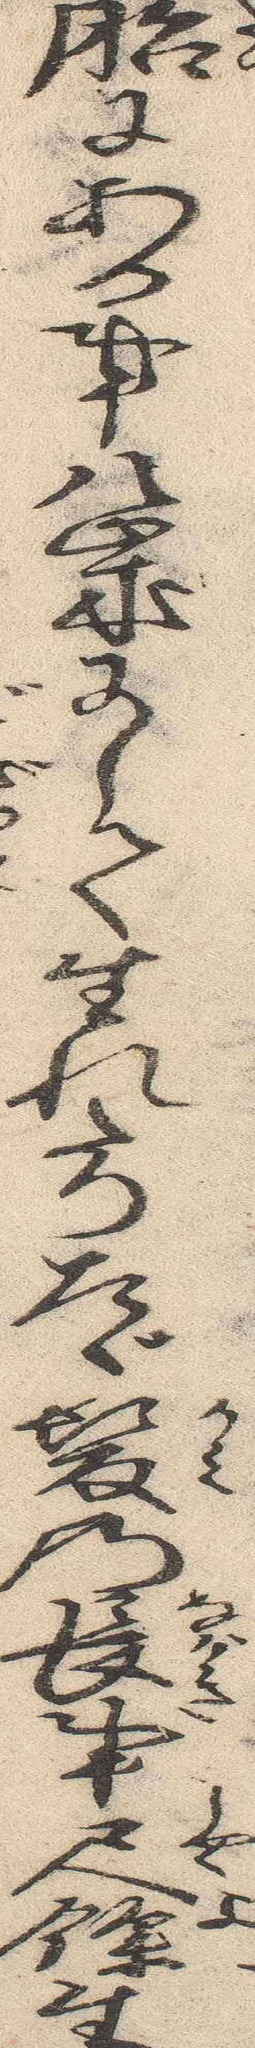胎にある事八歳にして生れたりたゞ髪の長事尺餘生
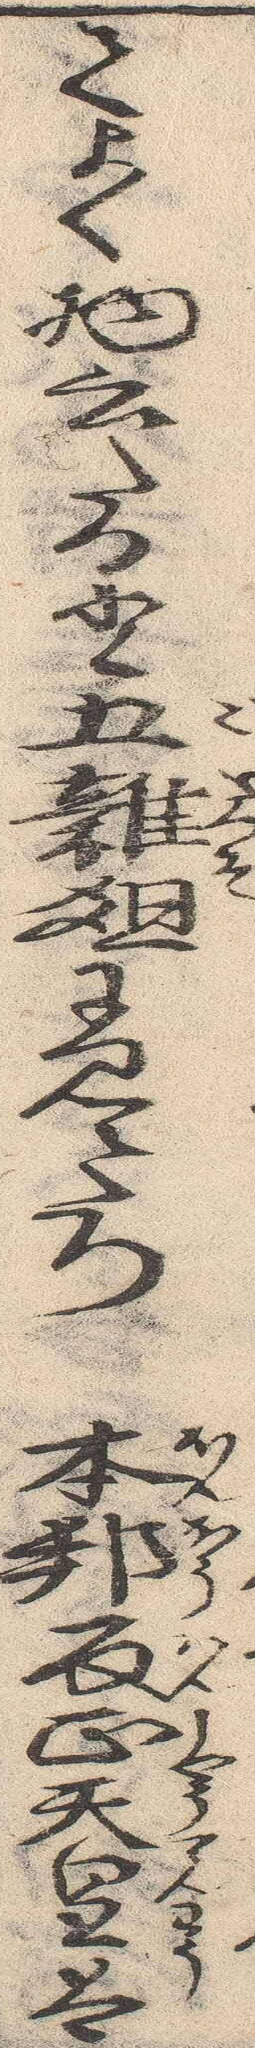てよく物云たると五雜俎に見えたり本邦反正天皇は
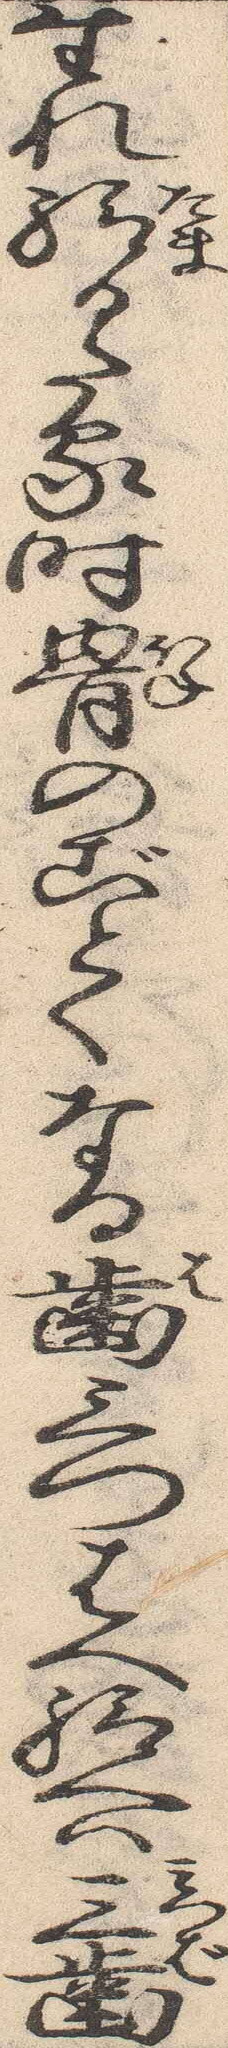生れ給ひたる時骨のごとくなる歯三つはへ給へは三歯
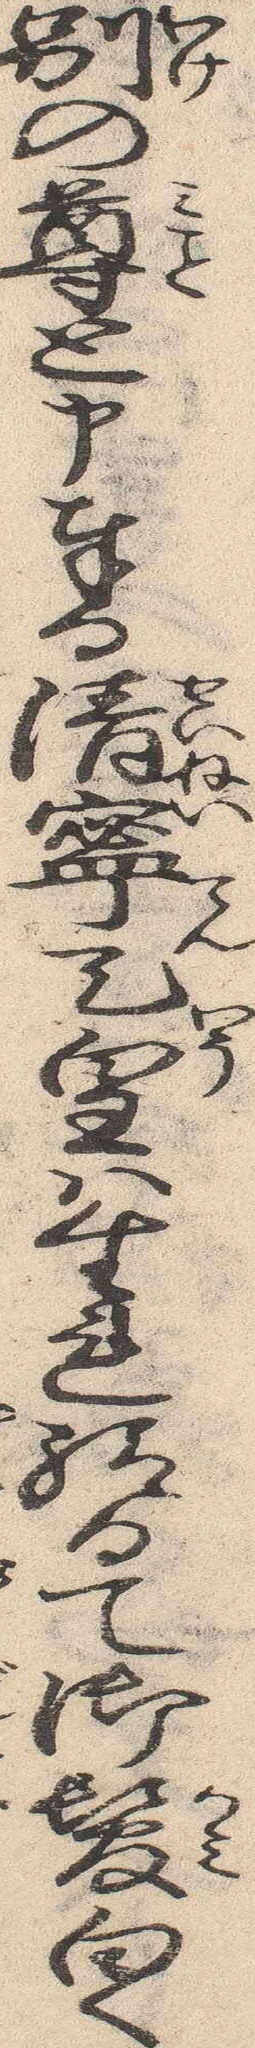別の尊と申奉る清寧天皇は生れ給ひて御髪白く
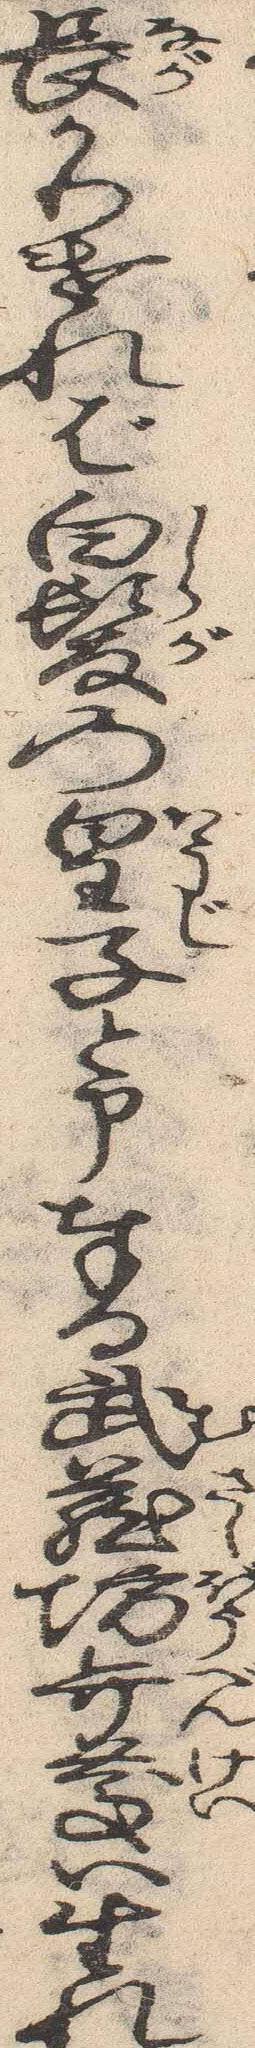長かりければ白髪の皇子と申奉る武蔵坊弁慶は生れ
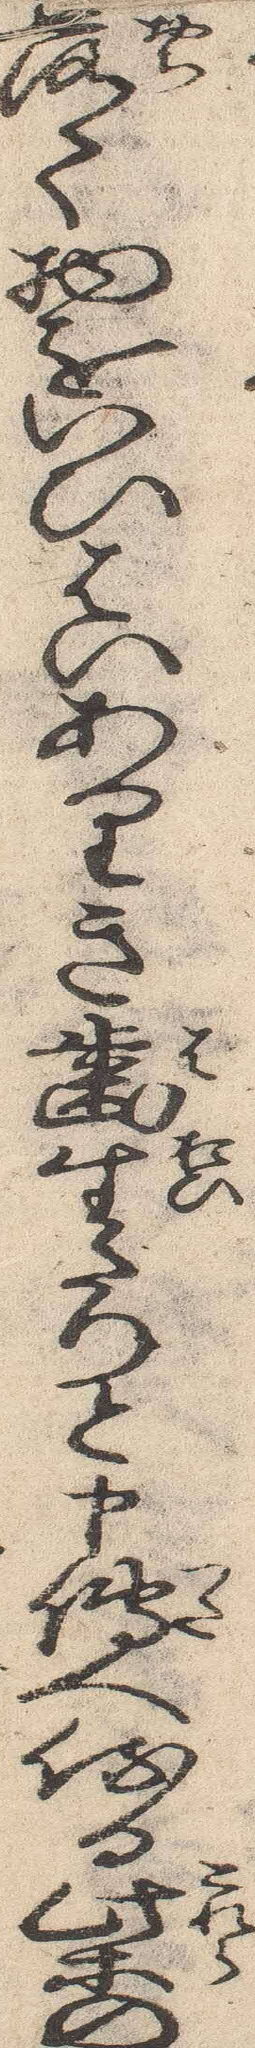落て物をいひはいありき歯生たりと申傳へ侍る此等の
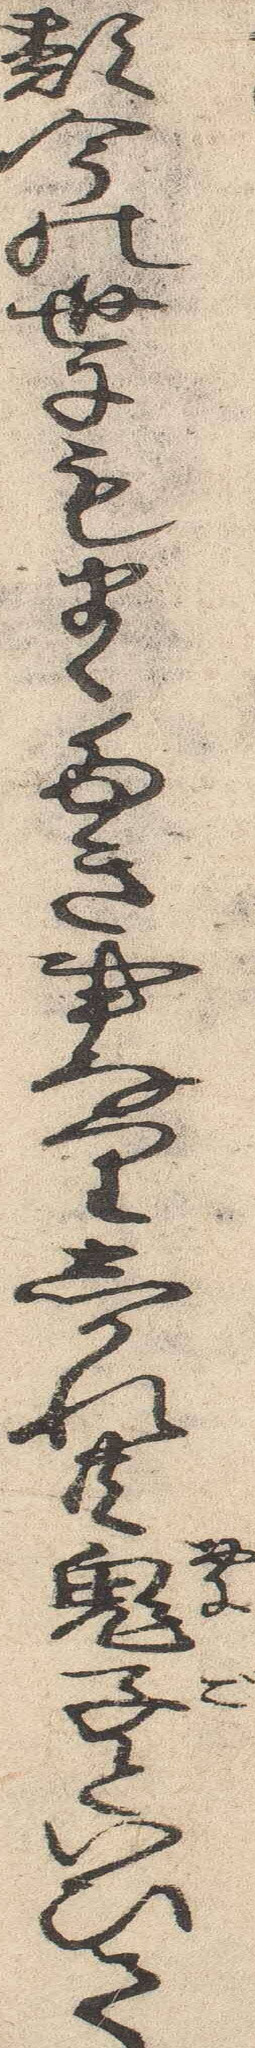類今の世にもまゝ多き事なりしかれ共鬼子といひて
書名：小児必用養育草
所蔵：東京学芸大学附属図書館 国文学研究資料館
